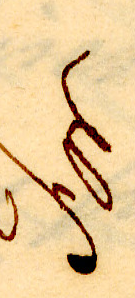For
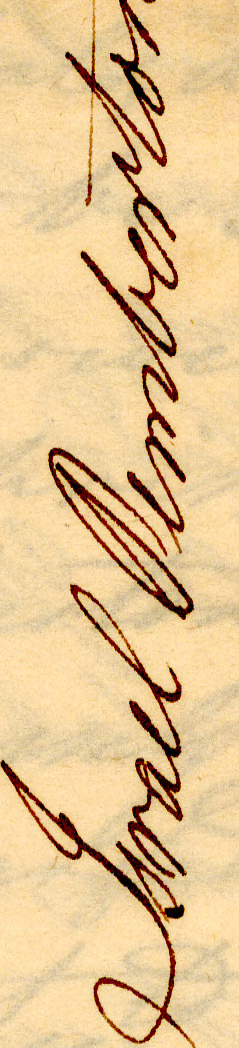Israel Pemberton
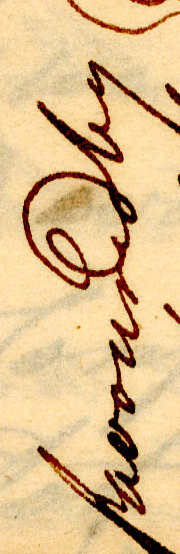favoured by
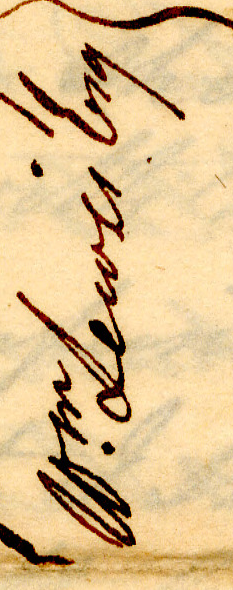W^m. Lewis Esq
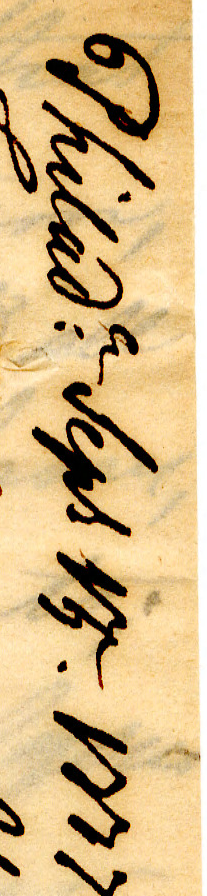Philad^a: Sept 15. 1777
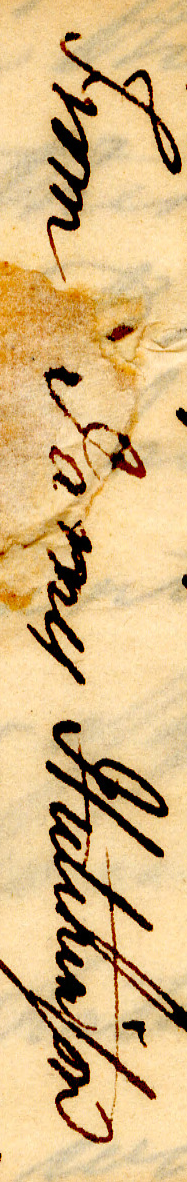From James Hutchinson
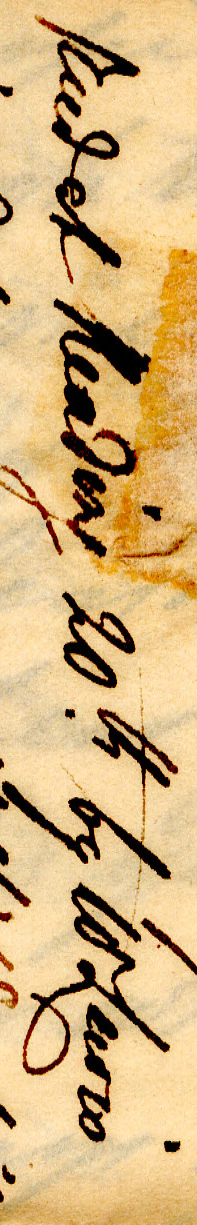recd at Reading 20^th. by W Lewis
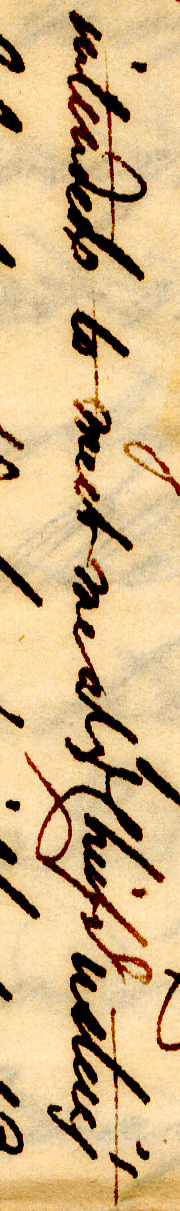intended to meet me at y^e Chief Justice's
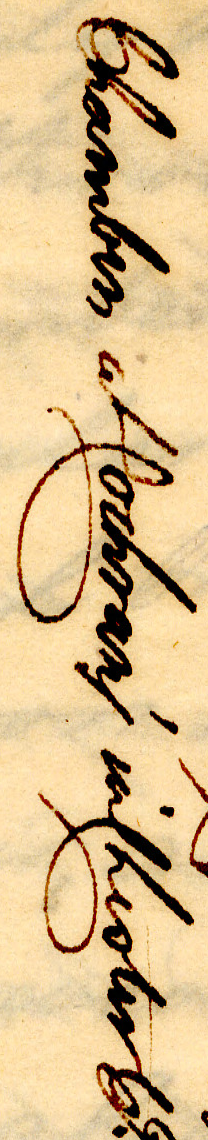Chamber at Cochran's in Chester C^o.
